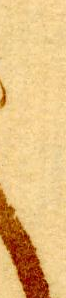To
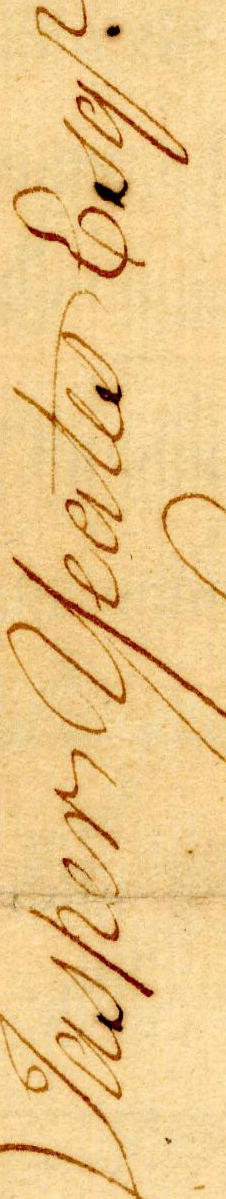Jasper Yeates Esq^r.
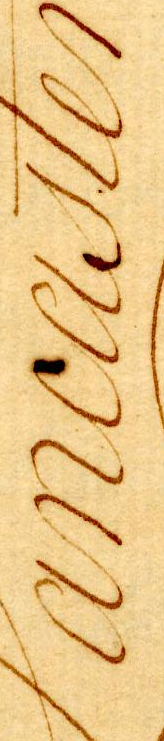Lancaster
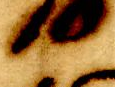10
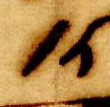15
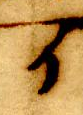5
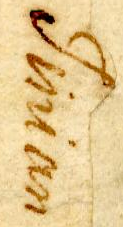Tinian
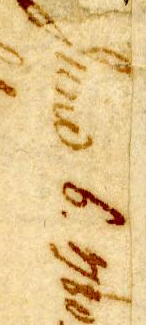June 6. 1780
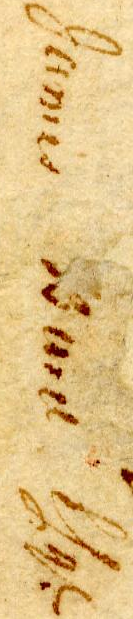James Burd Esq^r.
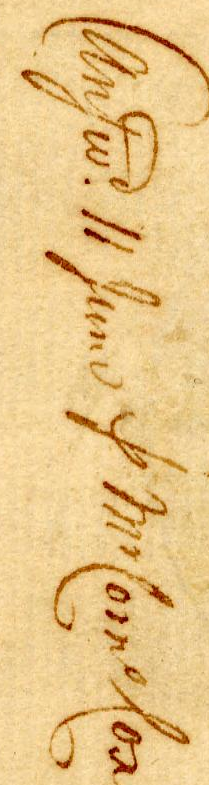(Answ^d. 11 June per M^ Corn^o Cox)
